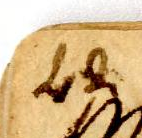42
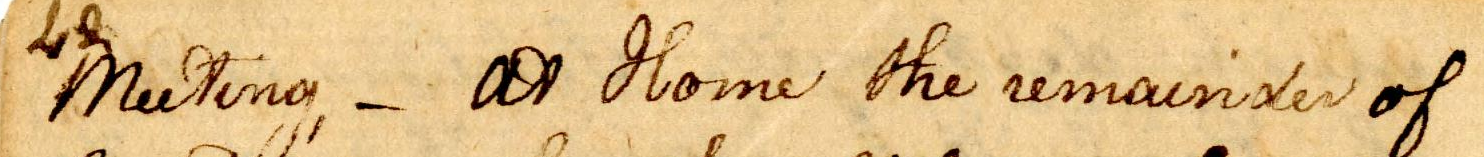Meeting- At Home the remainder of
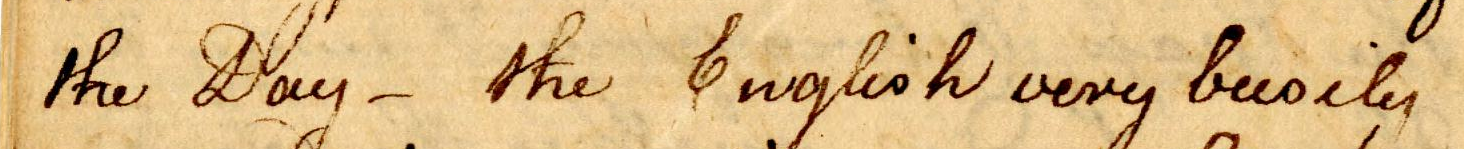the Day- the English very busily
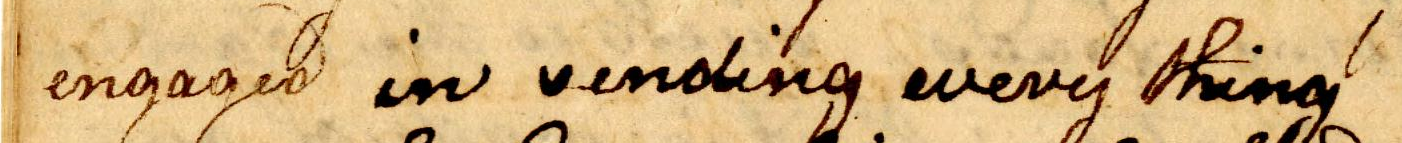engaged in sending every thing
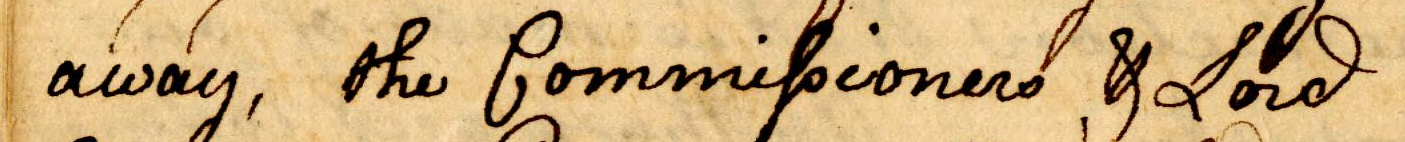away, the Commissioners & Lord
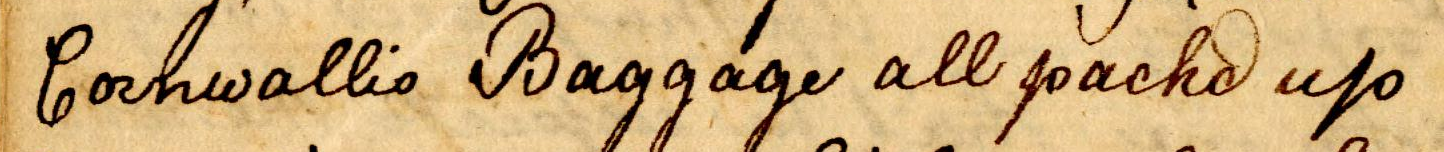Cornwallis Baggage all packd up
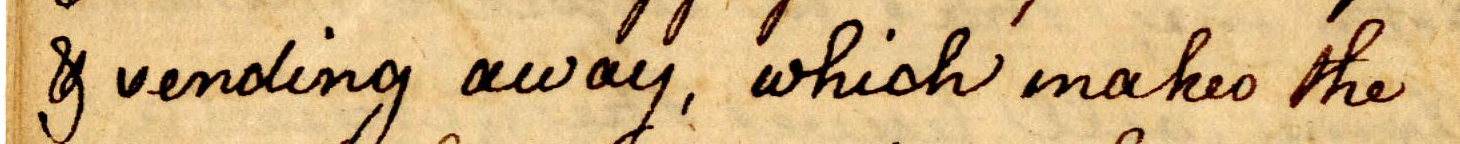& sending away, which makes the
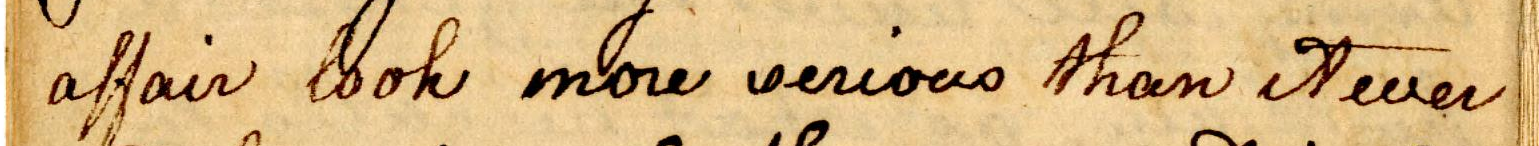affair look more serious than it ever
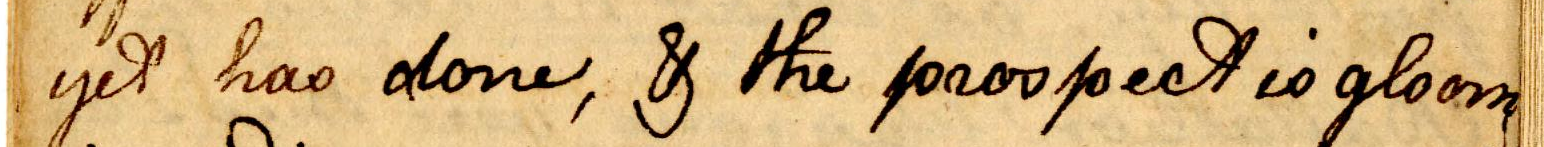yet has done, & the prospect is gloomy
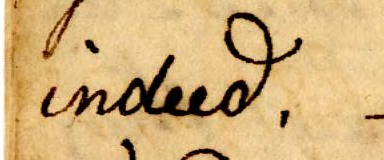indeed,
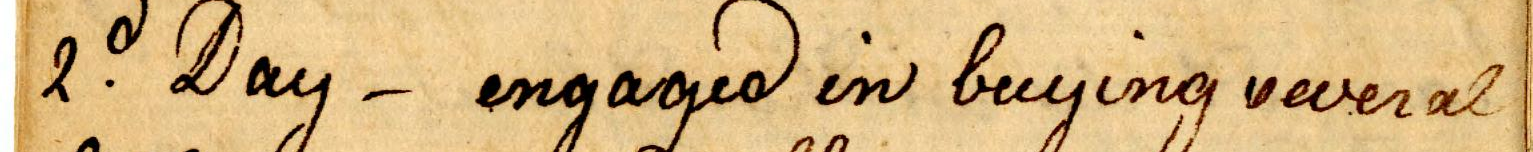2^d Day- engaged in buying several
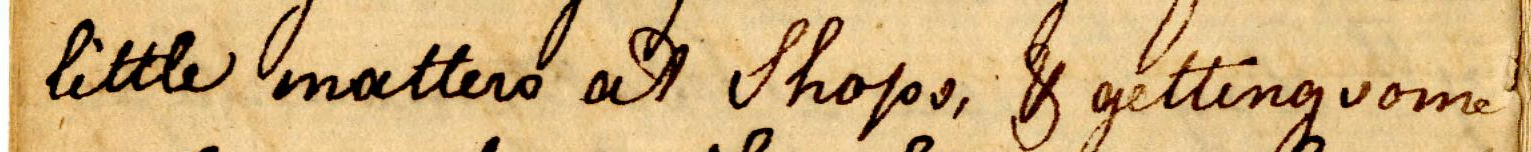little matters at Shops, & getting some
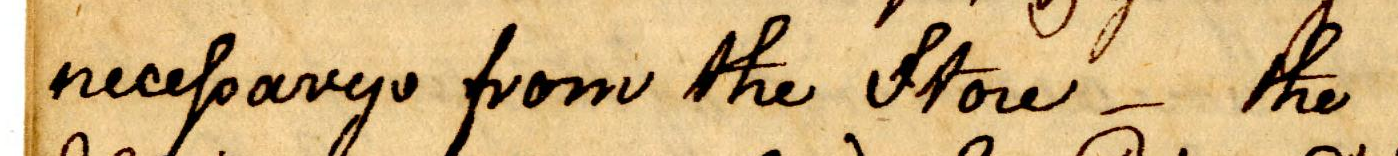necessarys from the Store- the
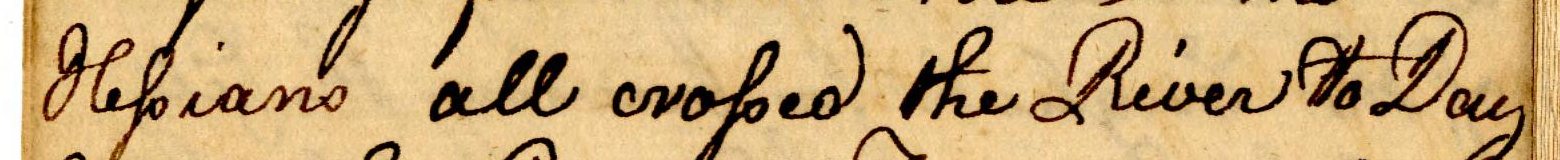Hessians all crossed the River to Day
